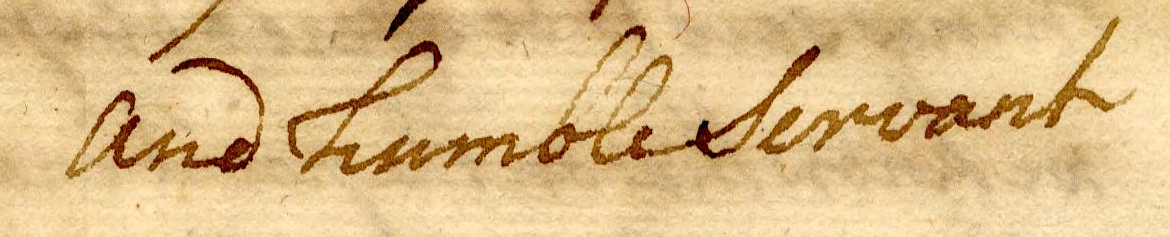And humble Servant
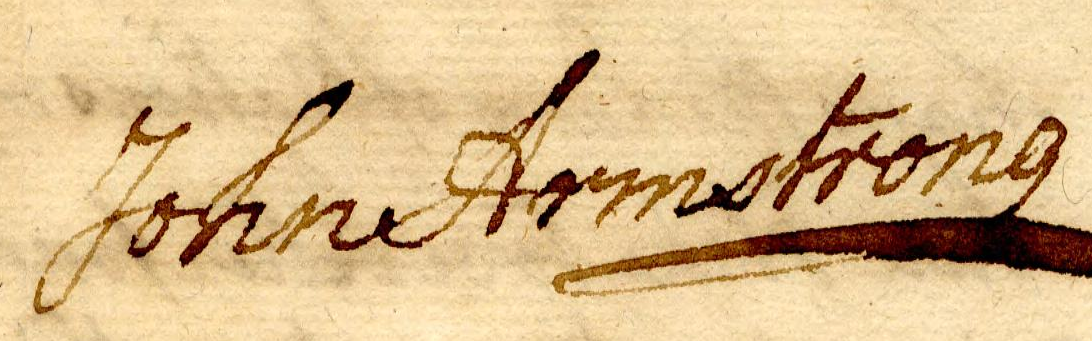John Armstrong
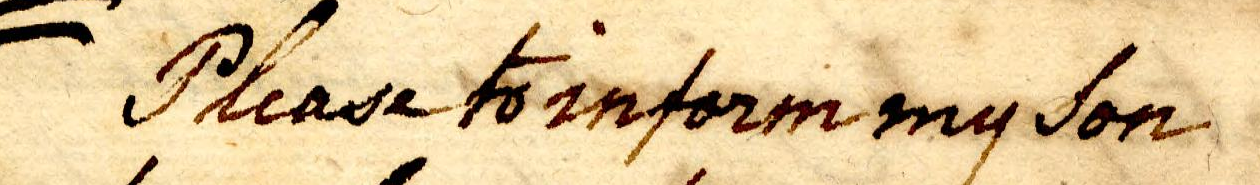Please to inform my Son
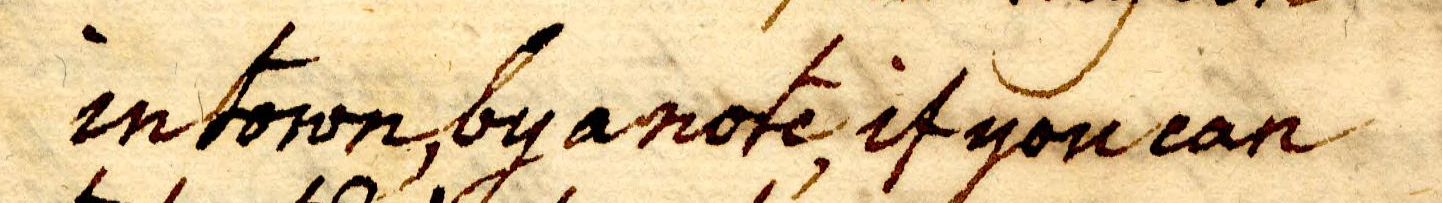in town, by a note, if you can
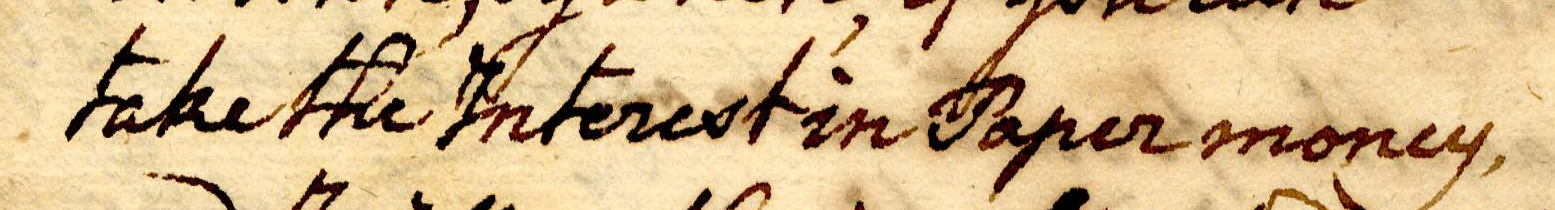take the Interest in Paper money,
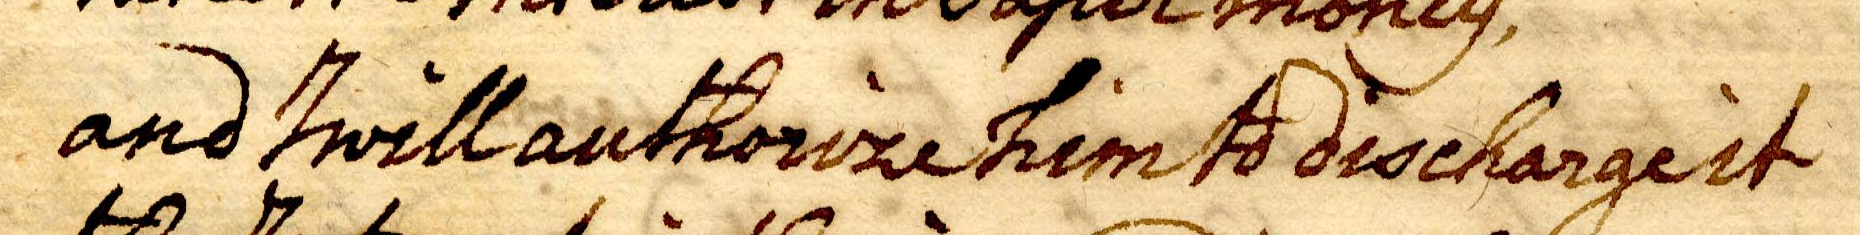and I will authorize him to discharge it
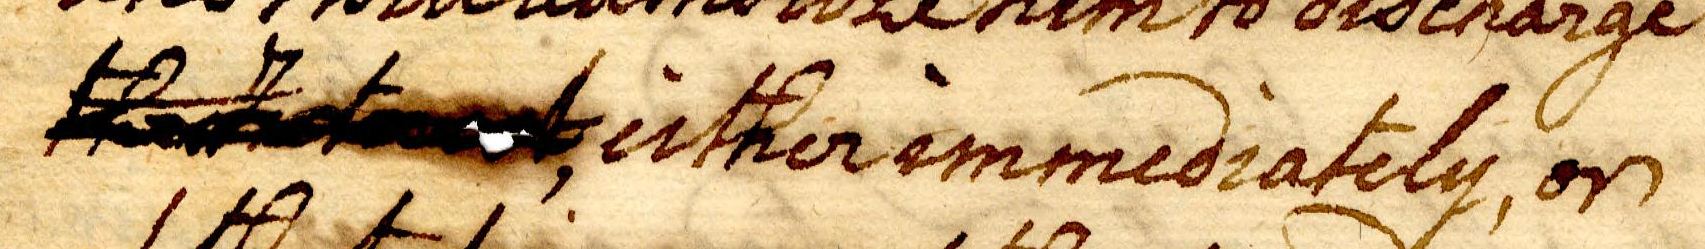[the Interest], either immediately, or
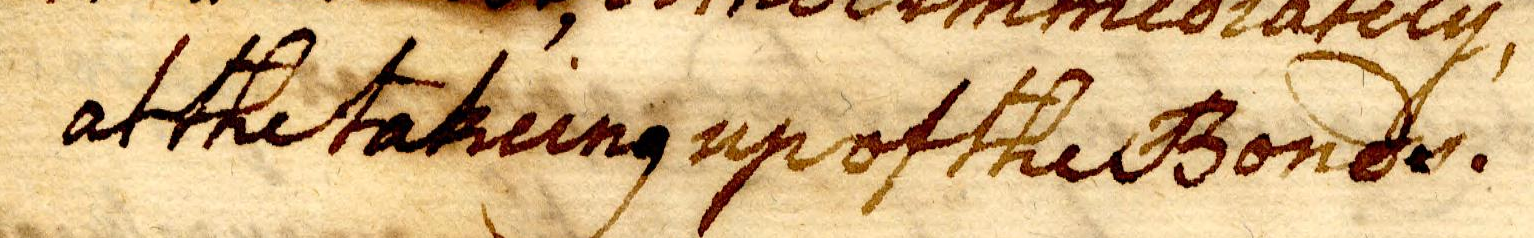at the takeing up of the Bonds.
